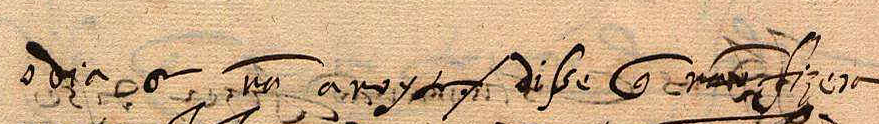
o dia sen̅a a noyte / disse q̅ não fizera
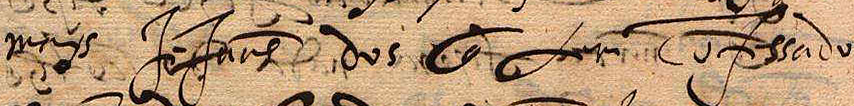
mays JeJuūs dos q̄ tem cōfessado
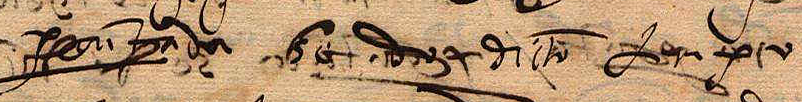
ꝑḡtada se do dicto tempo
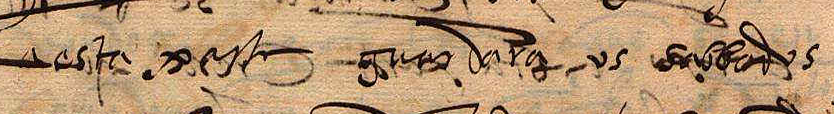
desta parte guadara os sabbados
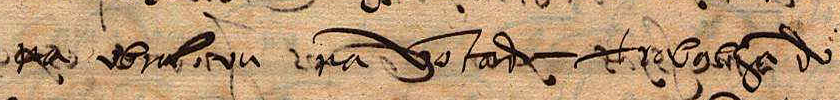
na obra ou na vōtade trabalhādo
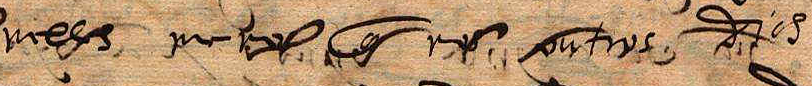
nelles menos q̄ nos outros dias
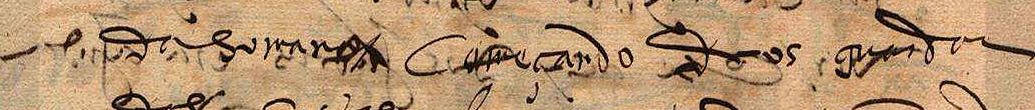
da somana Começando de os guardar
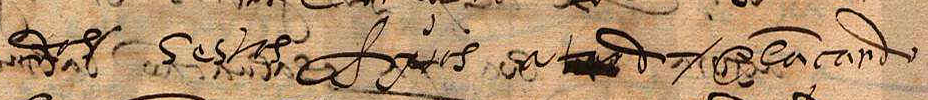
das sestas feyras a tarde / e lāçando
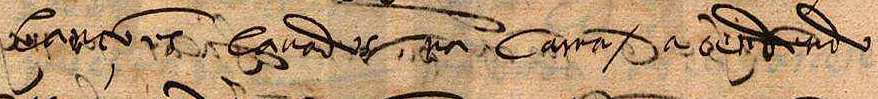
lançōes lauados na Cama / acendendo
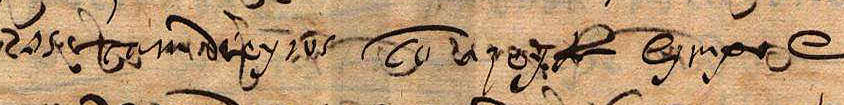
os camdieyros c̄o azeyte lympo e
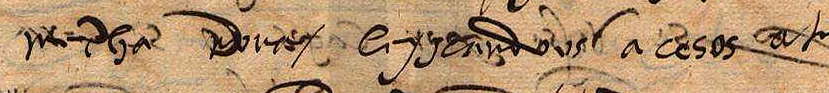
mecha noua / leyxandoos acesos ate
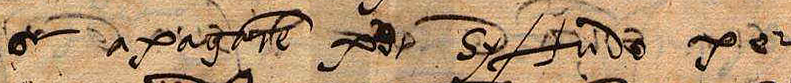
se apagarē por sy / tudo por
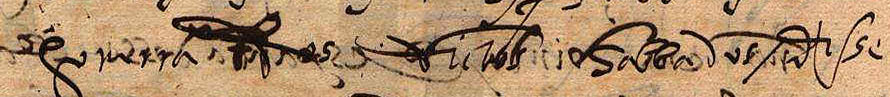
homrra dos dictos sabbados / disse
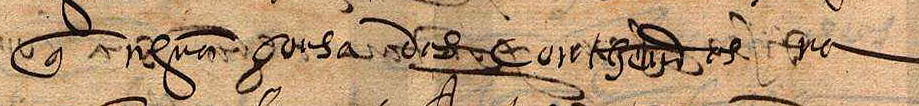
q̅ nhu̅a cousa das contheudas na
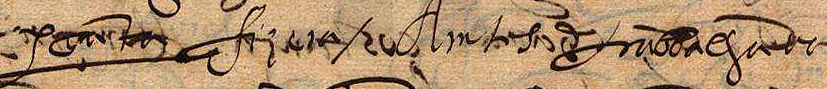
ꝑgūta fizera / Antes trabalhava
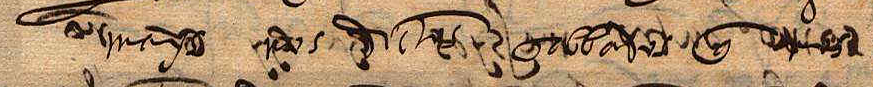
mays nos dict̄os sabbados q̄ nos
